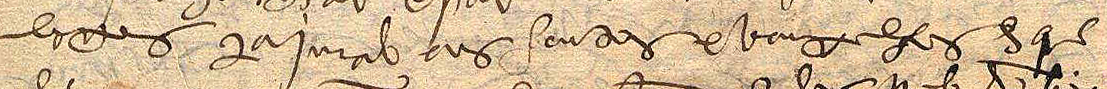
lagos ta jurado aos Santos evangelhos ē que
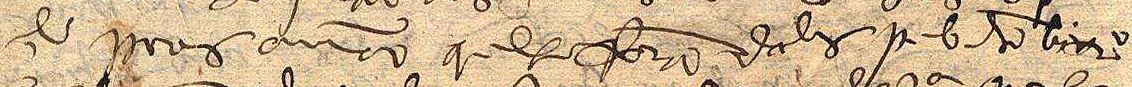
ele poos a mão que lhe forão dados pelo d̄to vigro
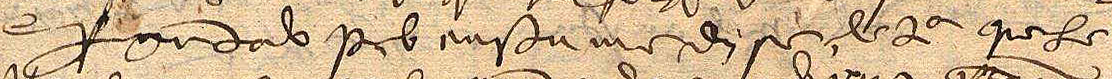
e ꝑgūtado pelo custume dise ele ta que he
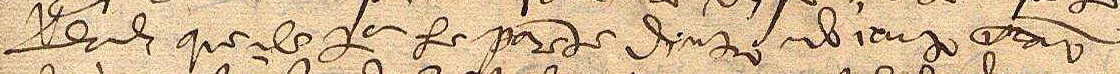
ꝟdade que ele ta he parēte dentro do carto grão
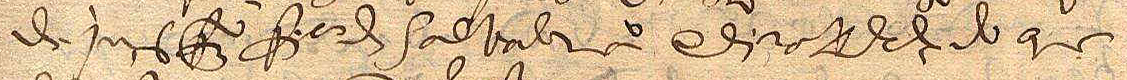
de jnes f̄rz fia de Salvador ao e dira ꝟdade do que
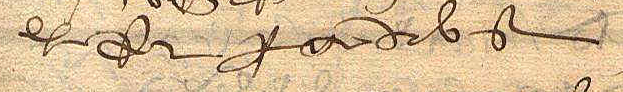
lhe for ꝑgūtado
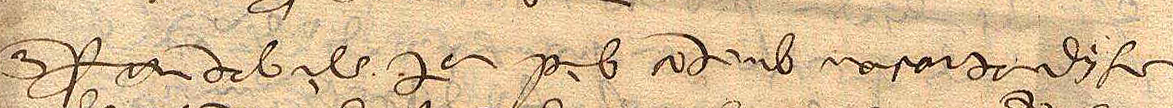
item ꝑgūtado ele ta pelo cōteudo na carta dyse
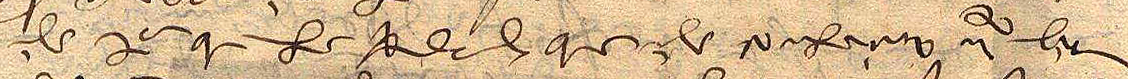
ele ta qe he ꝟdade que ele conheçeo mto bem
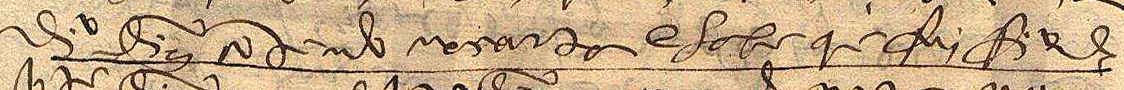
dio diz̄ cōteudo na carta e sabe que foy fio de
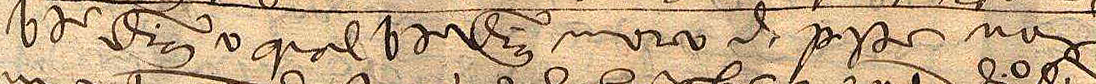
vte diz̄ o qual vte diz̄ moreo de peste nas
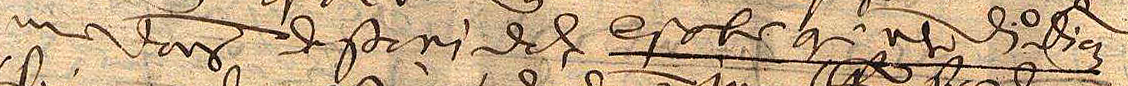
mrd̄as desta çidade e sabe que o ħo dio d̄iaz
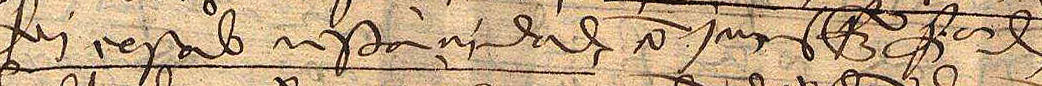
foj casado nesta çidade c̄o jnes f̄rz fia de
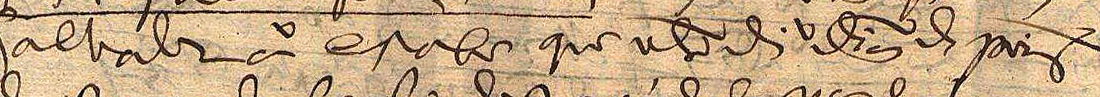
salvador ao e sabe que o ħo djo diaz̄ depois
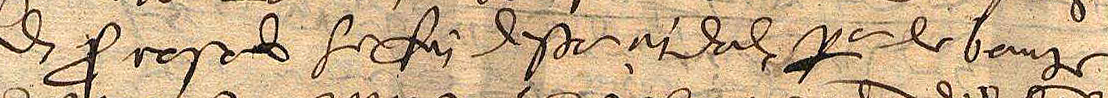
de ꞩ casado se foj desta çidade ꝑa levante
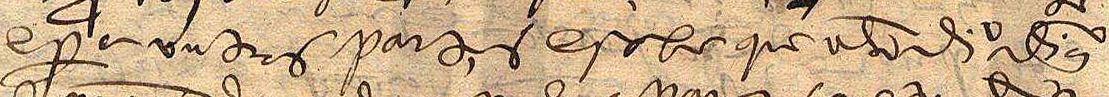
e ꝑa outras partes e sabe que o ħo dio dias̄
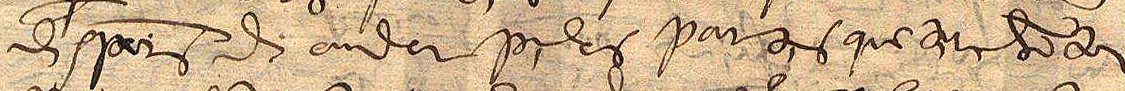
desp̄ois de andar pelas partes que tem ħo tor
